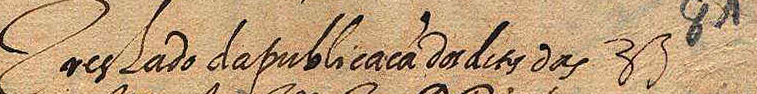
Treslado da publicaçā dos ditos das
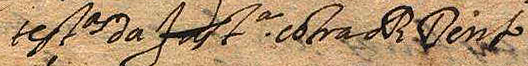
testas da Justa. cōtra o R. Bento
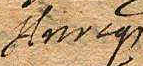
Anriqz.
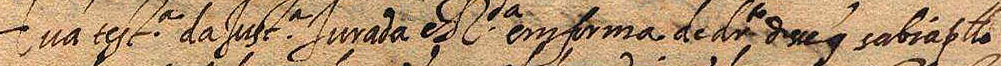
Huā test.a da Just.a Jurada e R.da em forma de drto disse q̄ sabia pll̄o
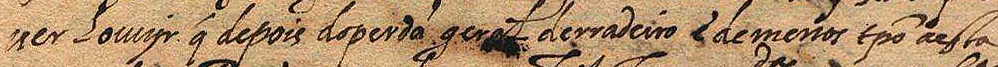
uer E ouuir q̄ depois do perdā geral derradeiro e de menos tpō a esta
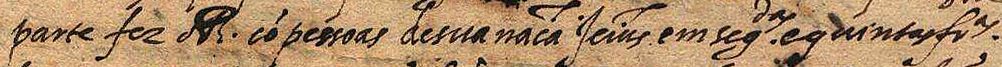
parte fez o R. cō pessoas de sua naçā Jeiūs em segdas. e quintas fras.
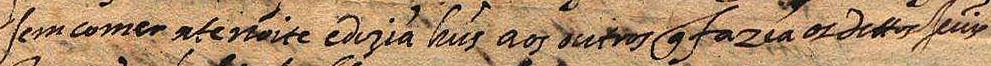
sem comer ate noite e diziā hūs aos outros q̄ fazia os dittos Jeiūs
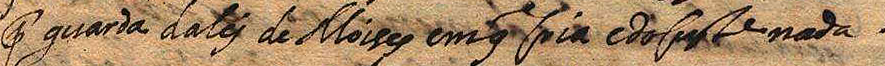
p̄ guarda da lej de Moises em q̄ Cria e do Custe nada.
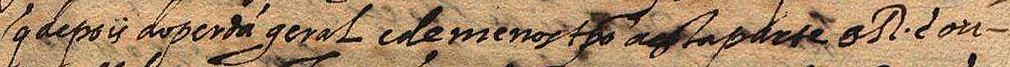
q̄ depois do perdā geral e de menos tpō a esta parte o R. e ou
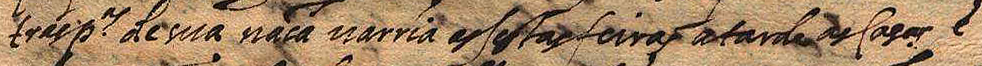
tras pas. de sua naçā uarriā as sestas feiras a tarde as casas e
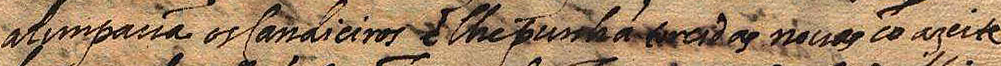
alimpauā os Candieiros e lhe punhā torcidas nouas cō azeite
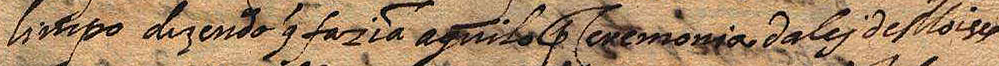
limpo dizendo q̄ faziā aquilo ꝑ Ceremonia da lej de Moises
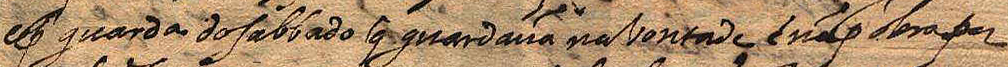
e p̄ guarda do sabbado q̄ guardauā na vontade e naõ p̄ obra por
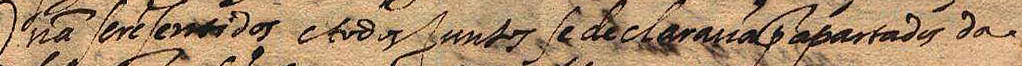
nā serē sentidos e todos Juntos se declarauā p̄ apartados da
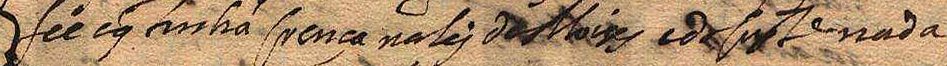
fee e q̄ tinhā Crença na lej de Moises e do Custe nada
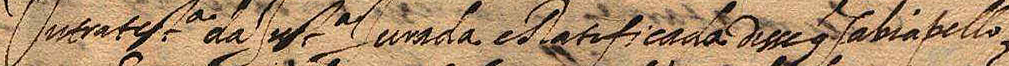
Outra testa da Justa Jurada e Ratificada disse q̄ sabia pello
